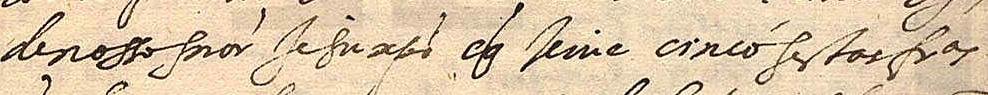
de nosso snor̄ Jesu xpō e q̄ Jeiue cinco sestas fras
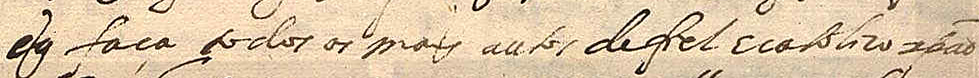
e q̄ faça todos os mais autos de fiel e catolico xpão
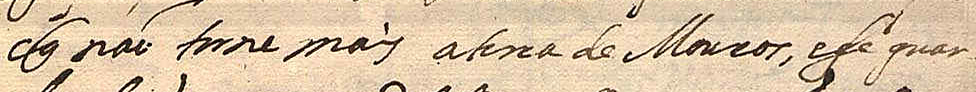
e q̄ naõ torne mais a terra de Mouros, e se guar
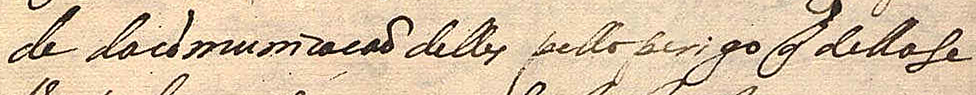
de da cōmunicaçaõ delles pello perigo q̄ della se
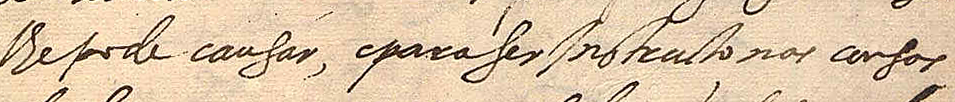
lhe pode causar, e para ser Jnstructo nas cousas
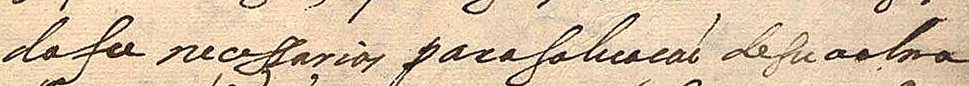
da fee necessarias para saluaçaõ de sua alma
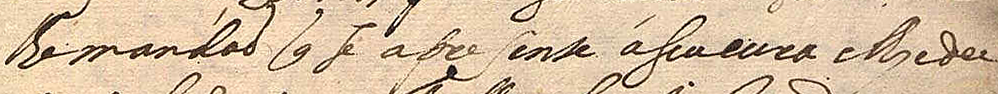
lhe mandão q̄ se apresente a seu cura e lhe dee
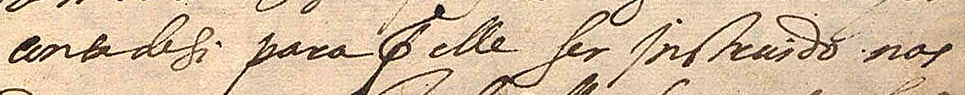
conta de si para p̄o elle ser Jnstruido nas
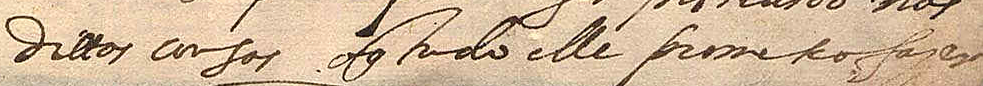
dittas cousas, o q̄ tudo elle prometeo fazer
